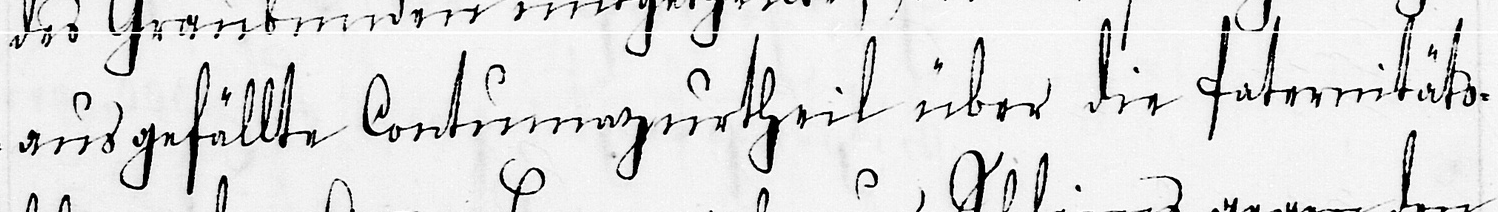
ausgefällte Contumazurtheil über die Paternitäts¬
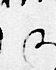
d.
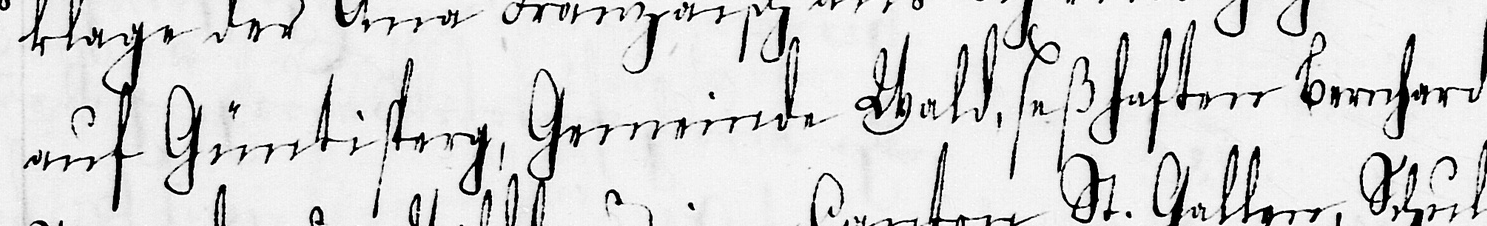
auf Güntisperg, Gemeinde Wald, seßhaften Bernhard
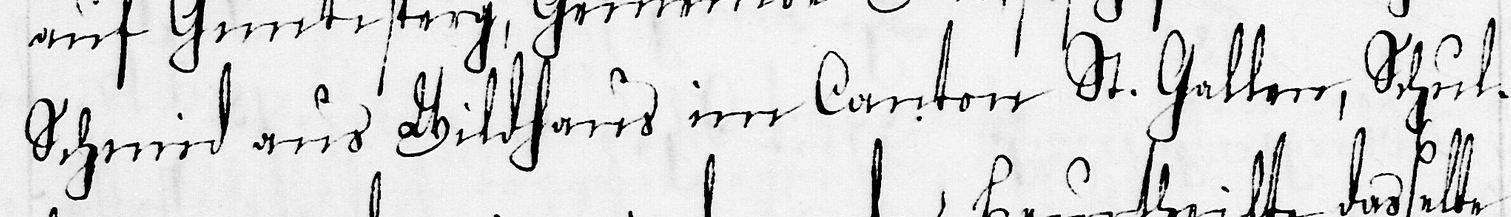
Schmid aus Wildhaus im Canton St. Gallen, Schul¬
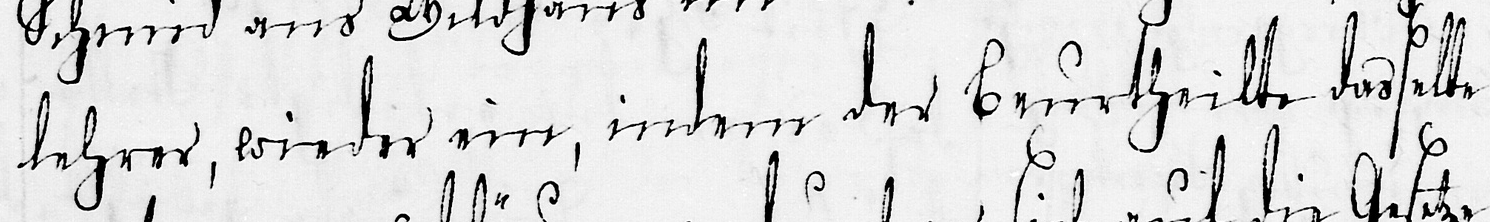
lehrer, wieder ein, indem der Beurtheilte dasselbe
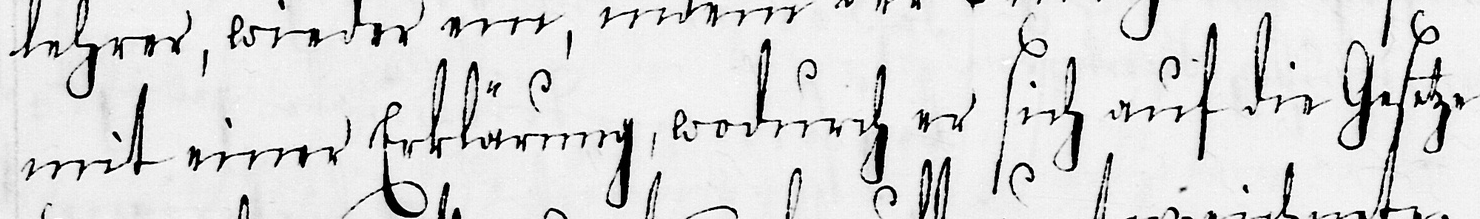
mit einer Erklärung, wodurch er sich auf die Gesetze
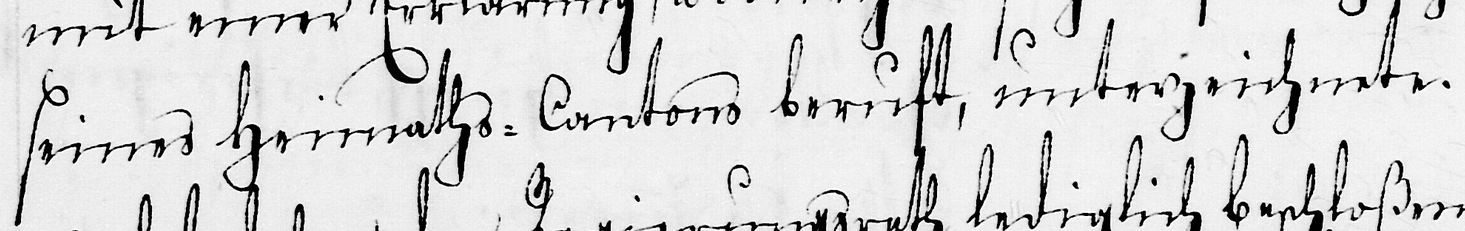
seines Heimaths-Cantons beruft, unterzeichnete.
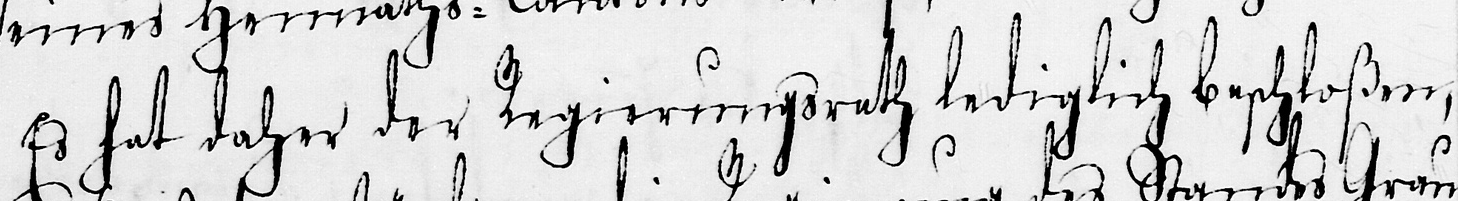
Es hat daher der Regierungsrath lediglich beschloßen,
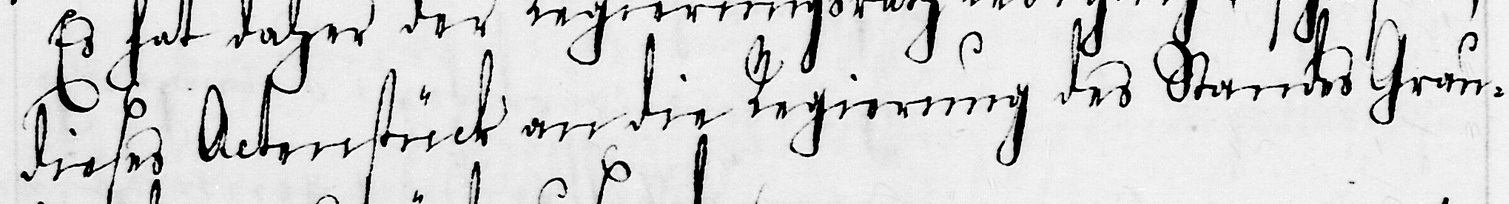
dieses Actenstück an die Regierung des Standes Grau¬
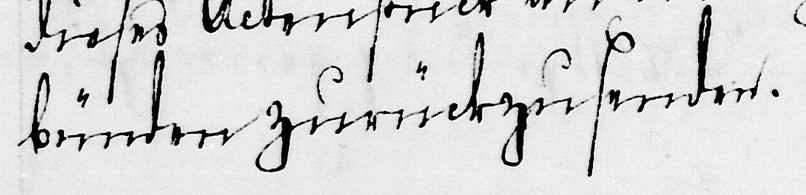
bünden zurückzusenden.
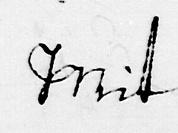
Mit
